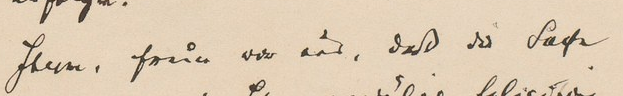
Item, freuen wir uns, daß die Sache
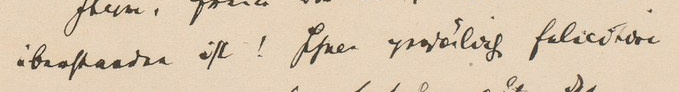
überstanden ist! Ihnen persönlich felicitire
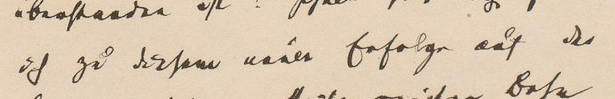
ich zu diesem neuen Erfolge auf der
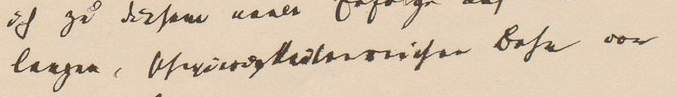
langen, schwierigkeitenreichen Bahn von
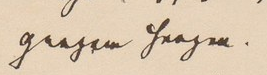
ganzem Herzen.
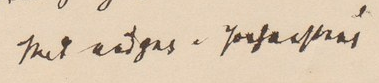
Mit ausgez. Hochachtung
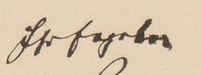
Ihr Ergebener
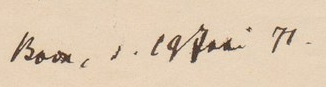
Bern, d. 19 Juni 71.
